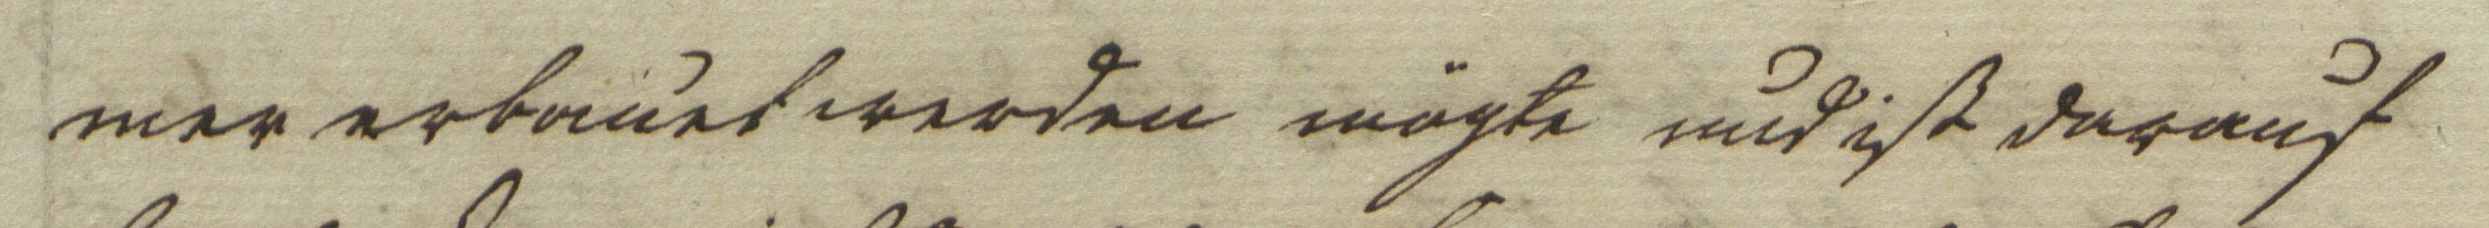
mer erbauet werden mögte und ist darauf
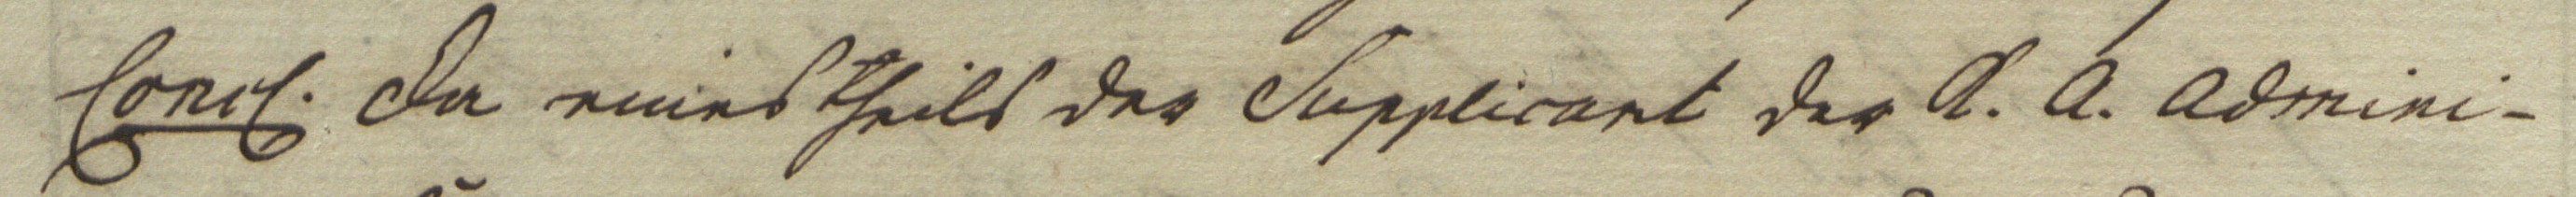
Concl. Da einestheils der Supplicant der A. A. Admini¬
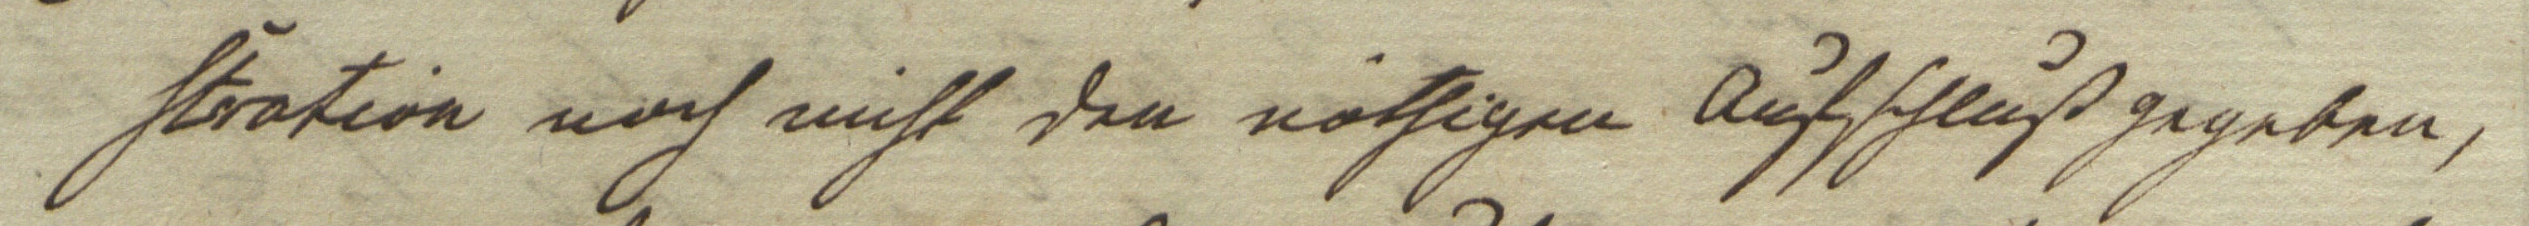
stration noch nicht den nöthigen Aufschluß gegeben,
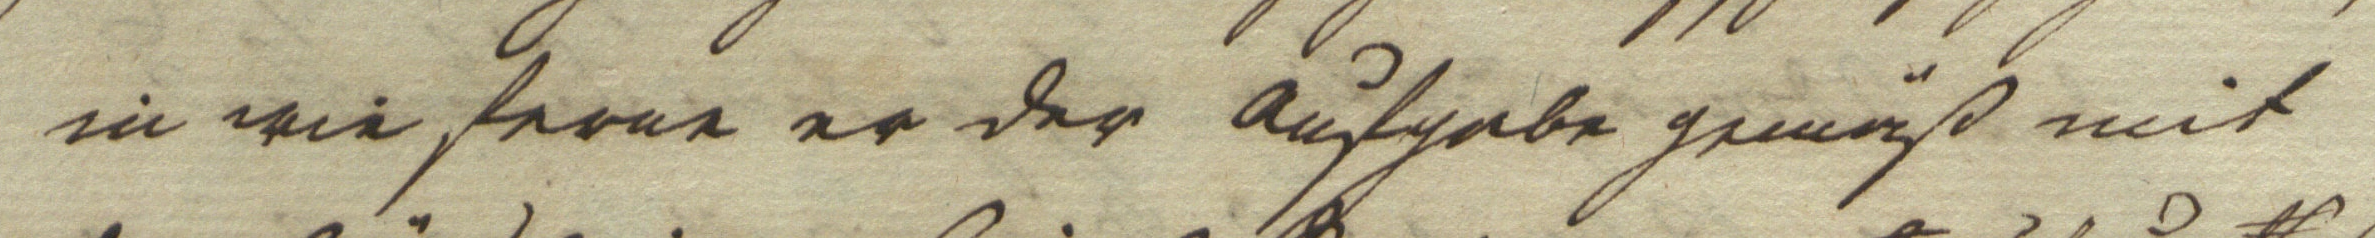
in wie ferne er der Aufgabe gemäß mit
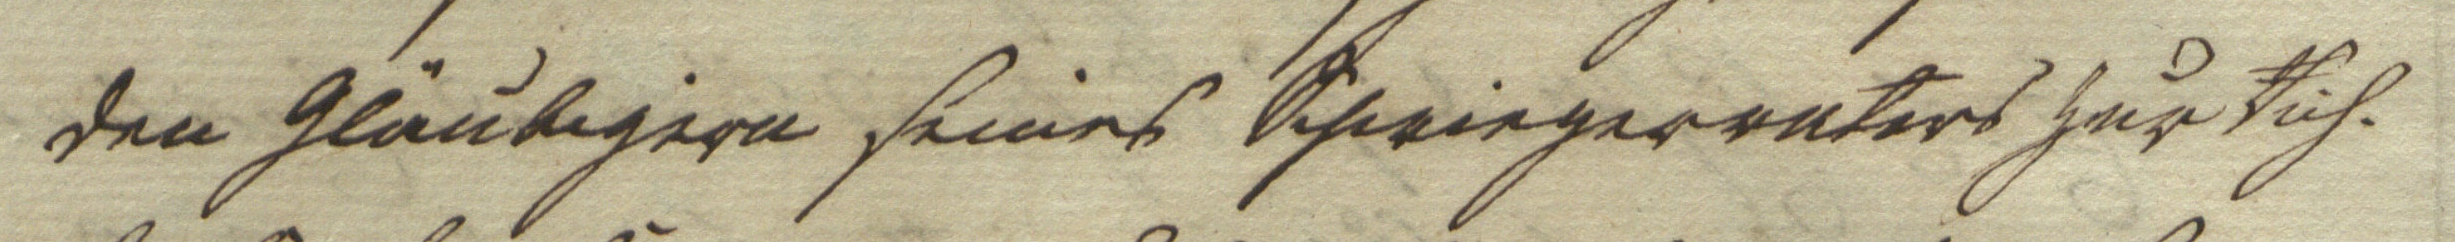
den Gläubigern sienes Schwiegervaters zur Rich¬
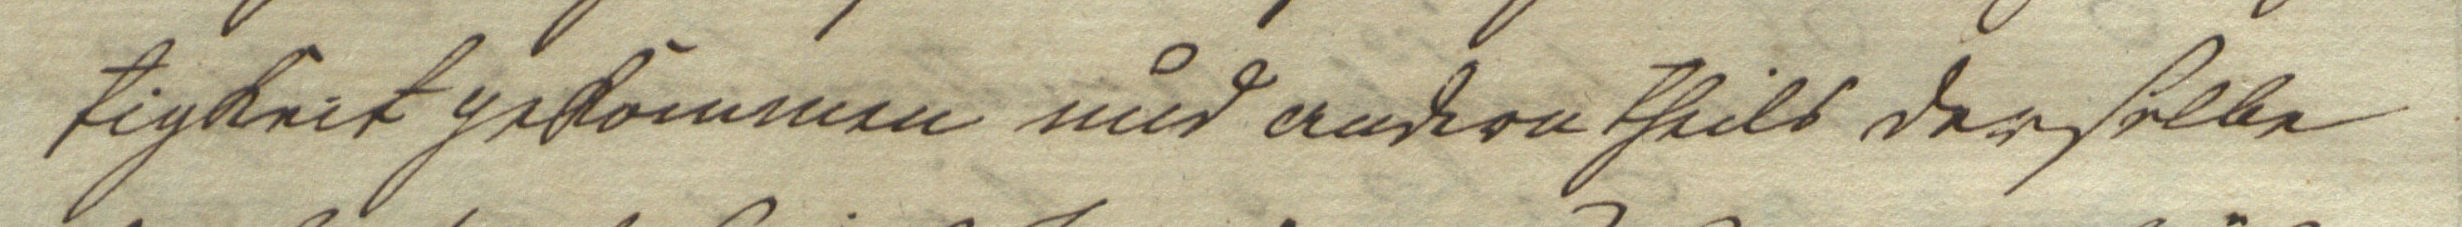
tigkeit gekommen und andern theils derselbe
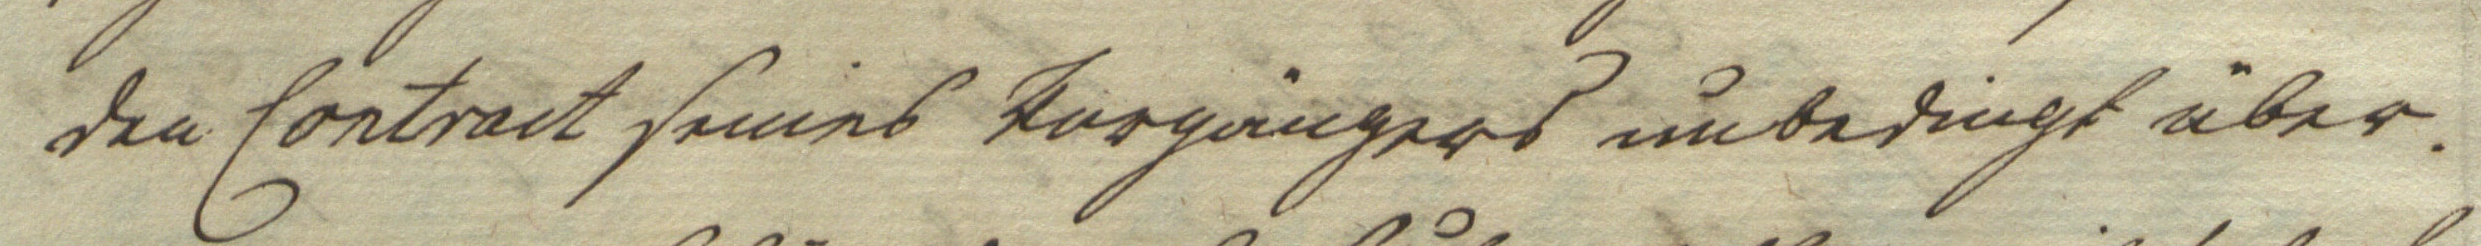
den Contract seines Vorgängers unbedingt über¬
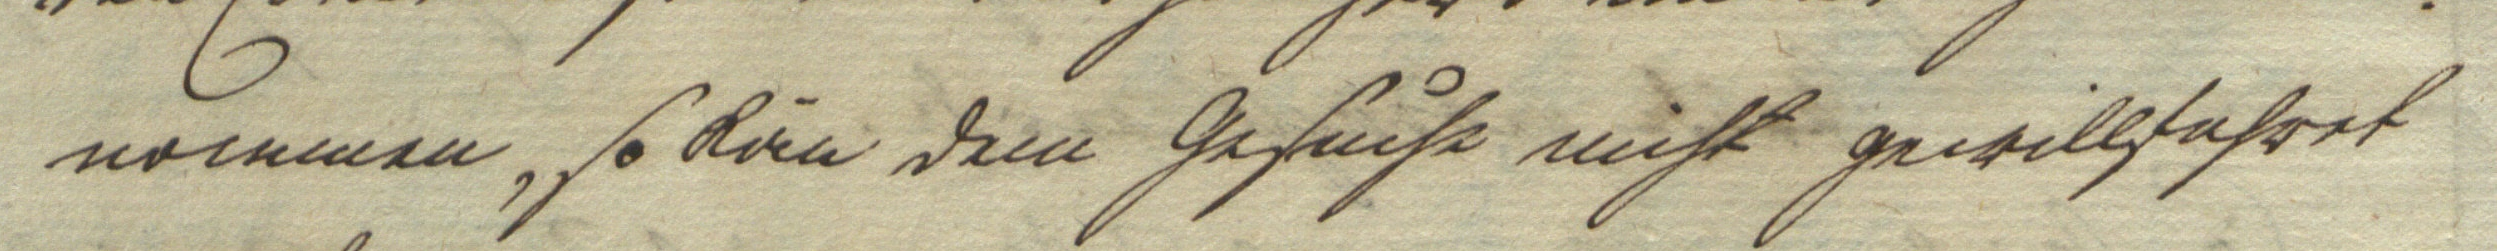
nommen, so kan dem Gesuche nicht gewillfahret
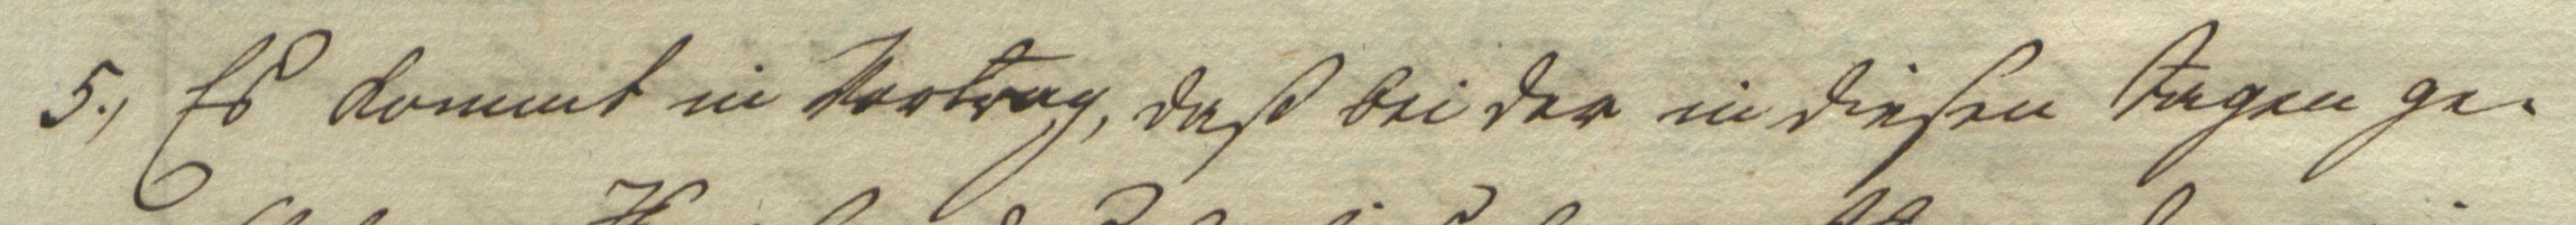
5., Es kommt in Vortrag, daß bei der in diesen Tagen ge¬
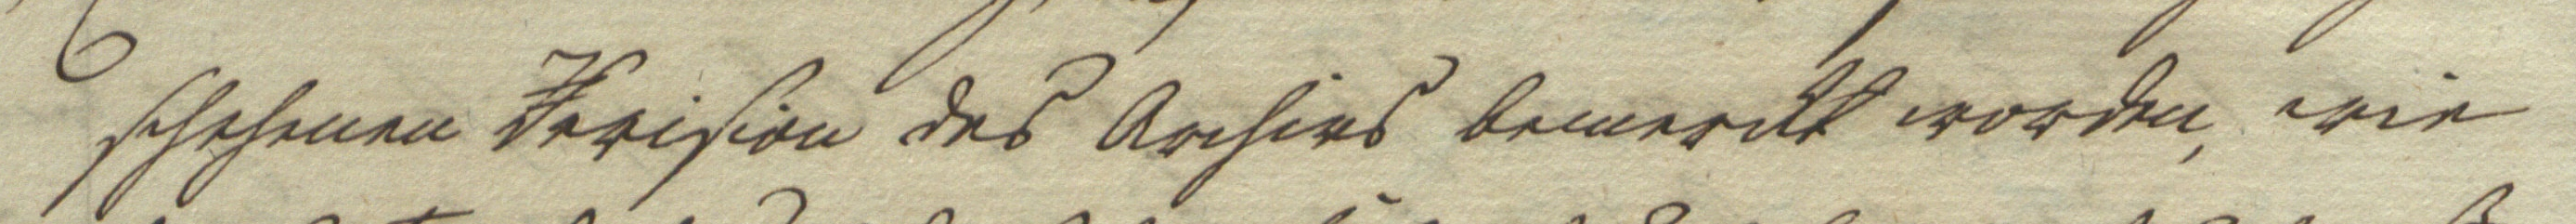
schehenen Revision des Archivs bemerkt worden, wie
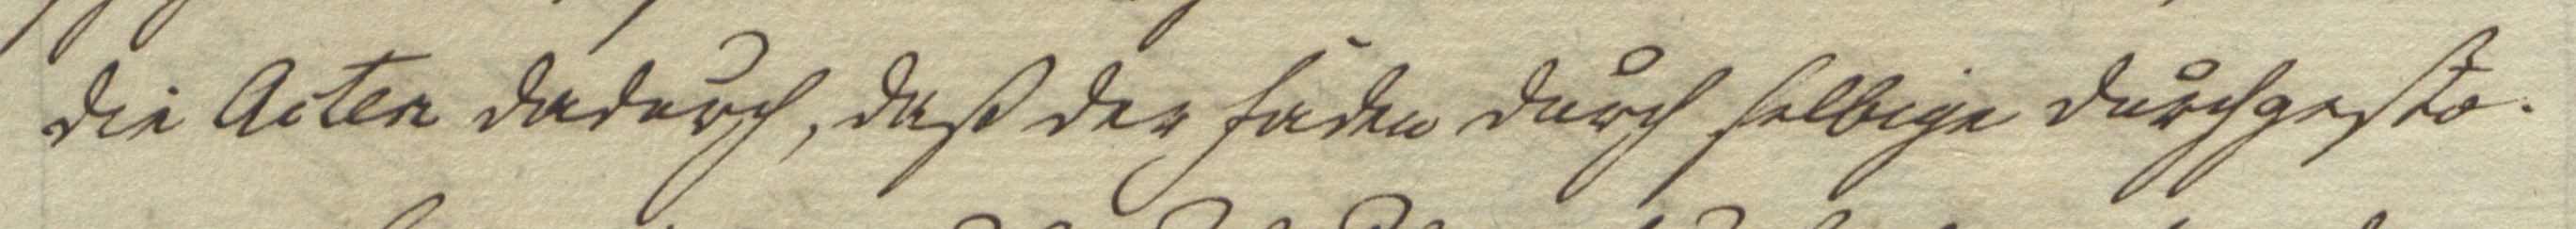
die Acten dadurch, daß der Faden durch selbige durchgesto¬¬
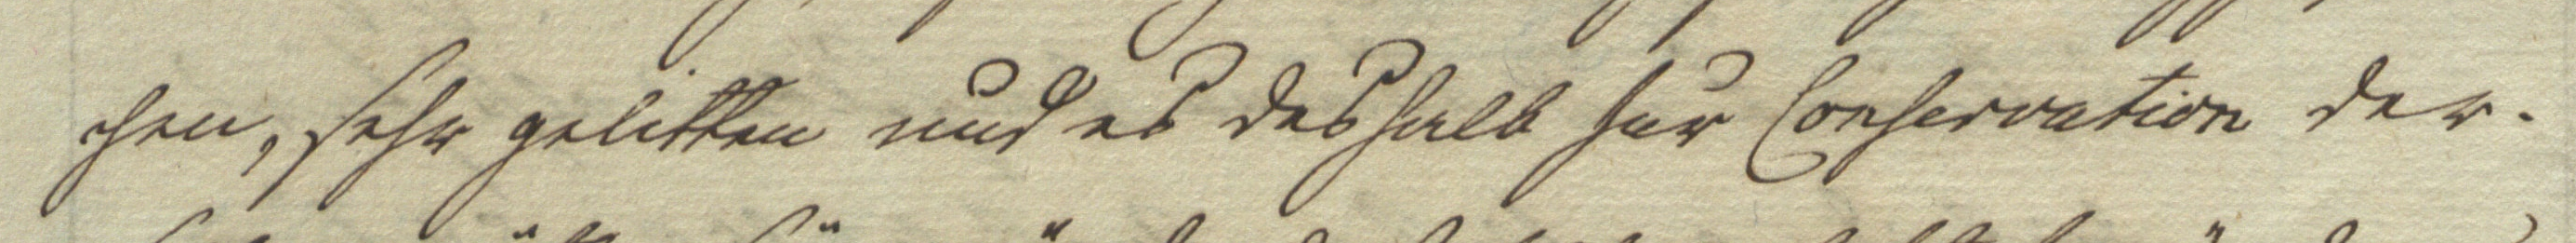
chen, sehr gelitten und es deshalb zur Conservation der¬
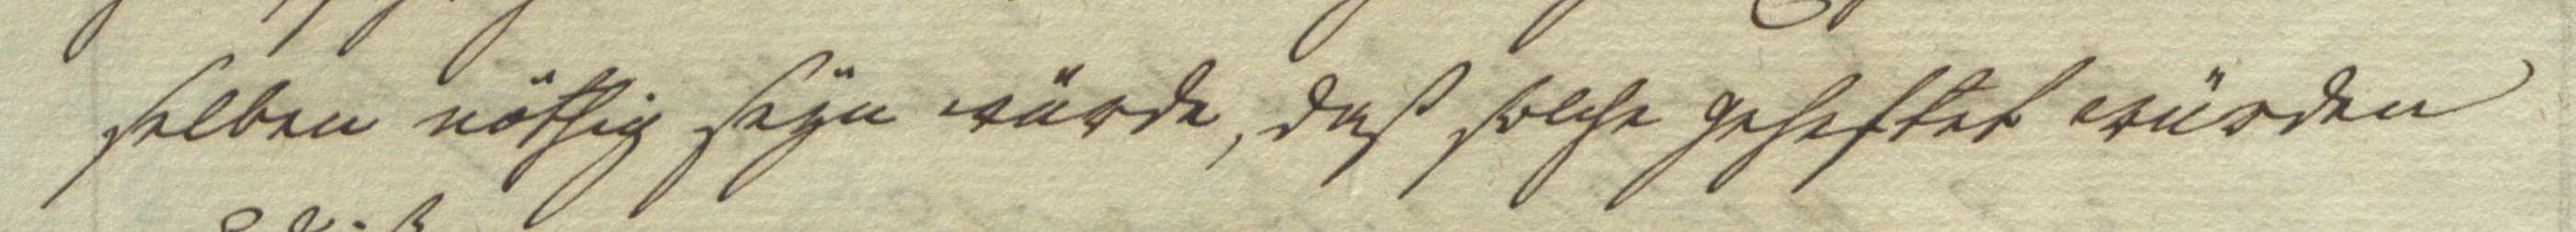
selben nöthig seyn würde, daß solche geheftet würden
